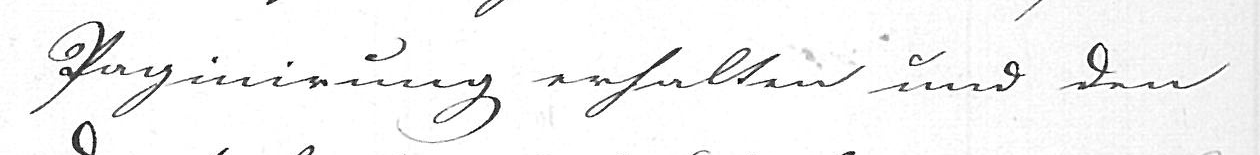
Paginirung erhalten und den
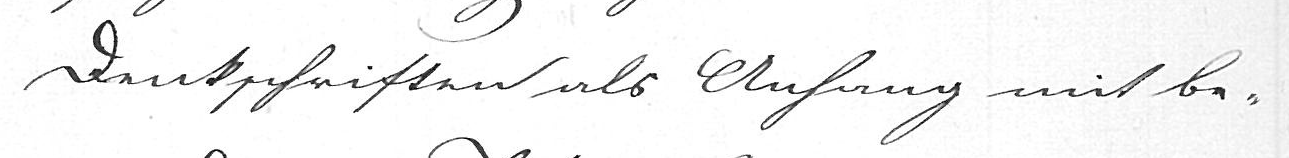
Druckschriften als Anhang mit be-
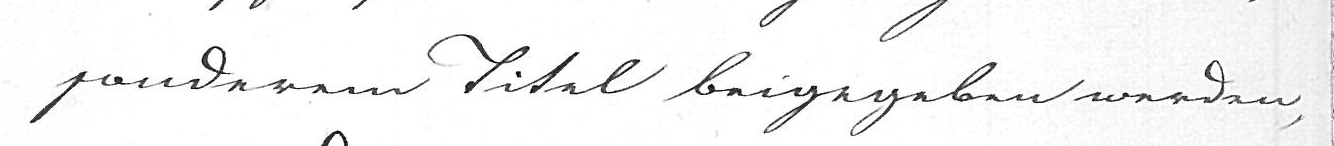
sonderem Titel beigegeben werden,
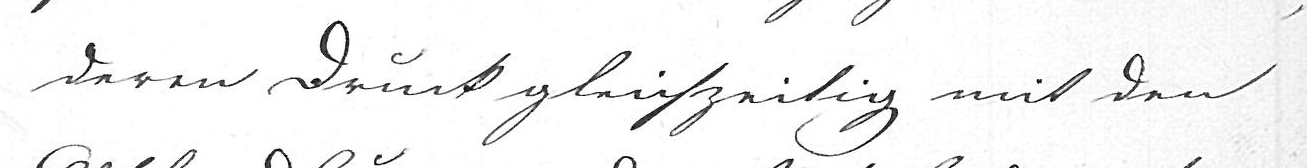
deren Druck gleichzeitig mit den
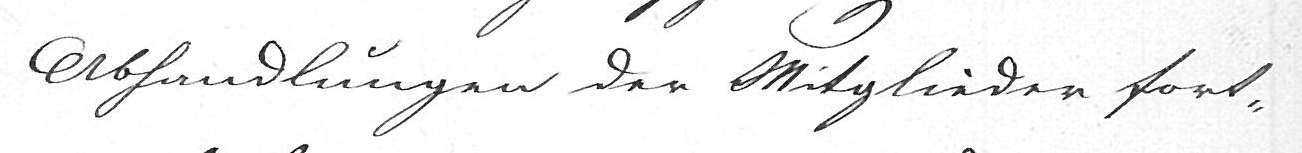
Abhandlungen der Mitglieder fort-
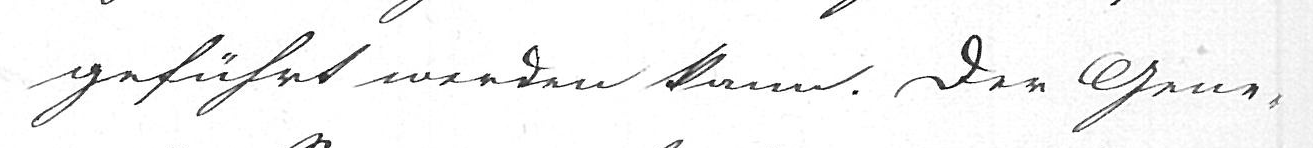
geführt werden kann. Der Gene-
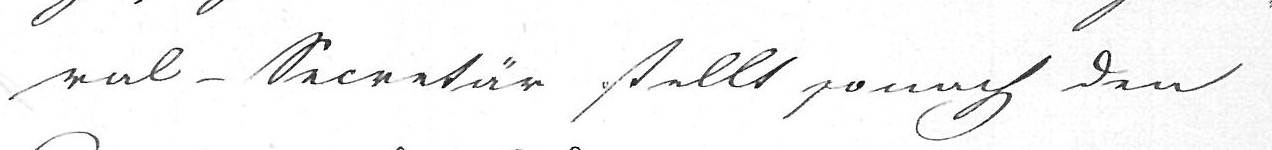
ral-Secretär stellt sonach den
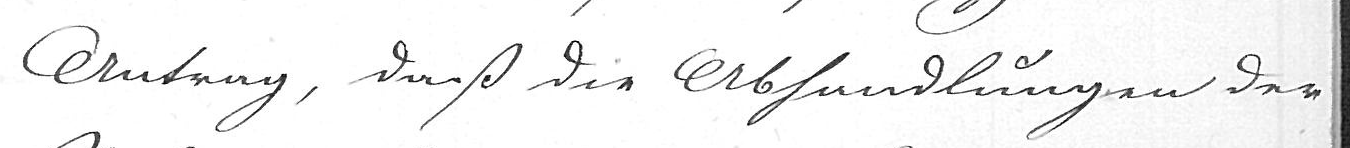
Antrag, daß die Abhandlungen der
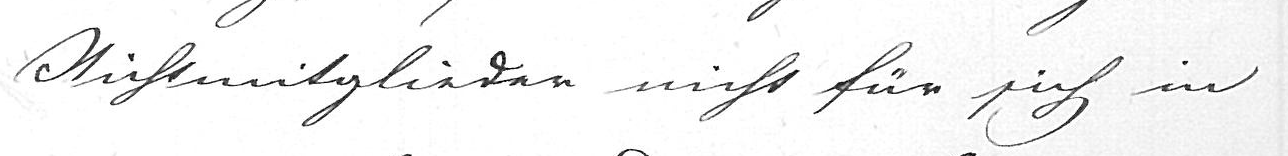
Nichtmitglieder nicht für sich in
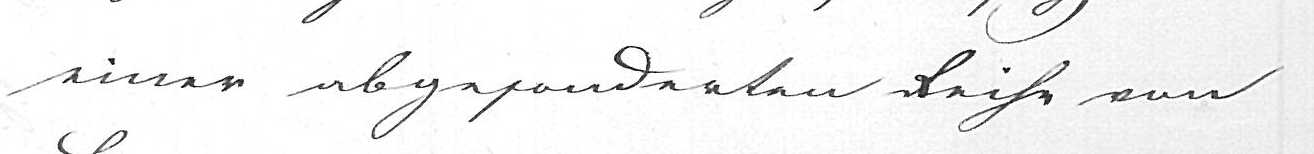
einer abgesonderten Reihe von
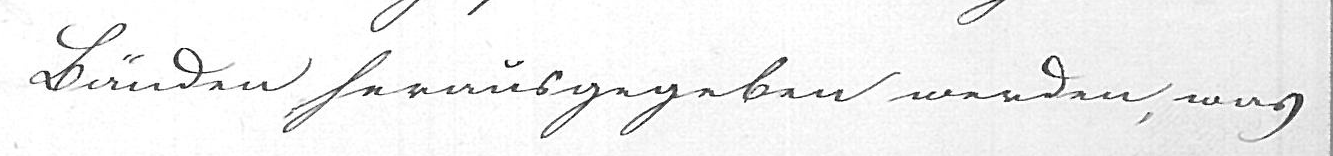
Bänden herausgegeben werden, was
